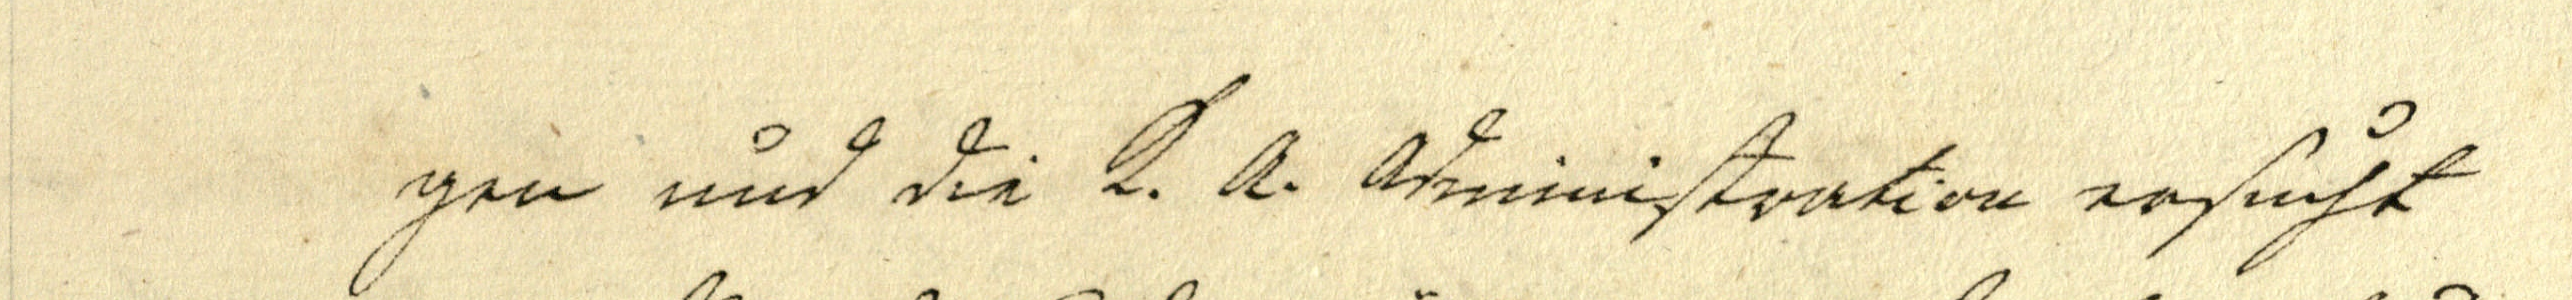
gen und die K. A. Administration ersucht
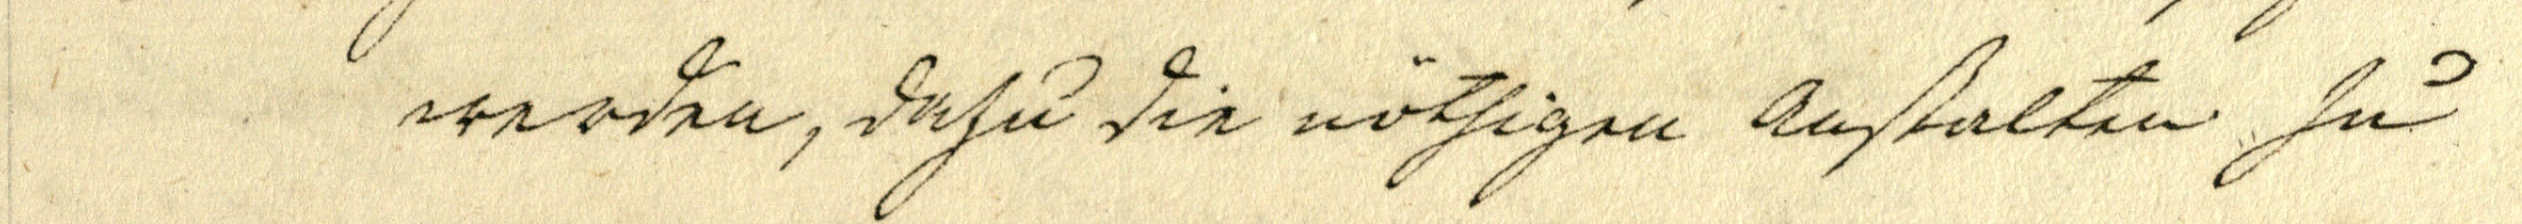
werden, dazu die nöthigen Anstalten zu
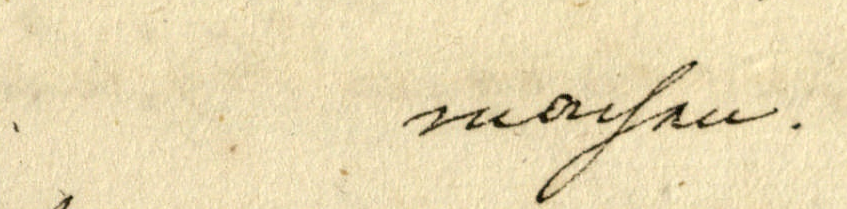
machen.
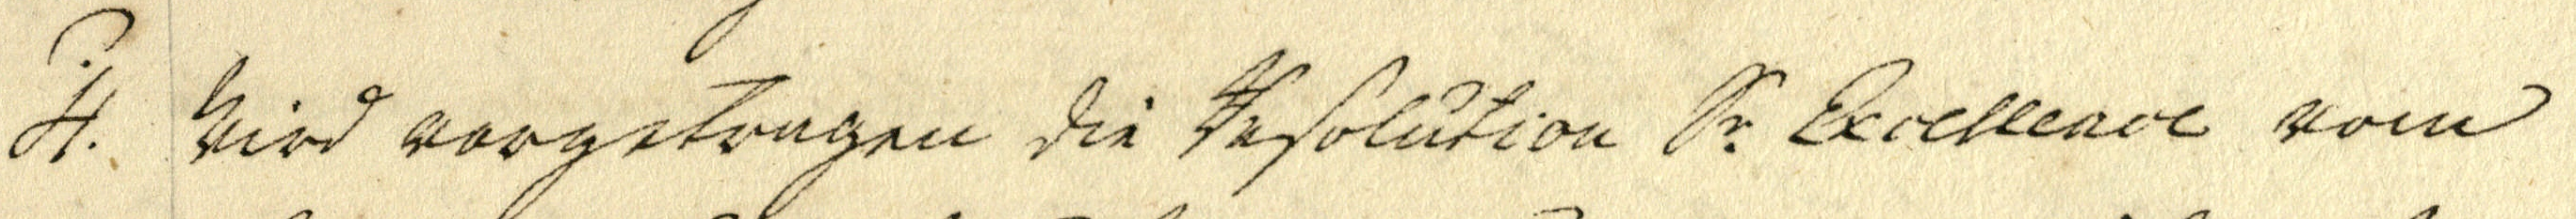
4. Wird vorgetragen die Resolution Sr. Excellence vom
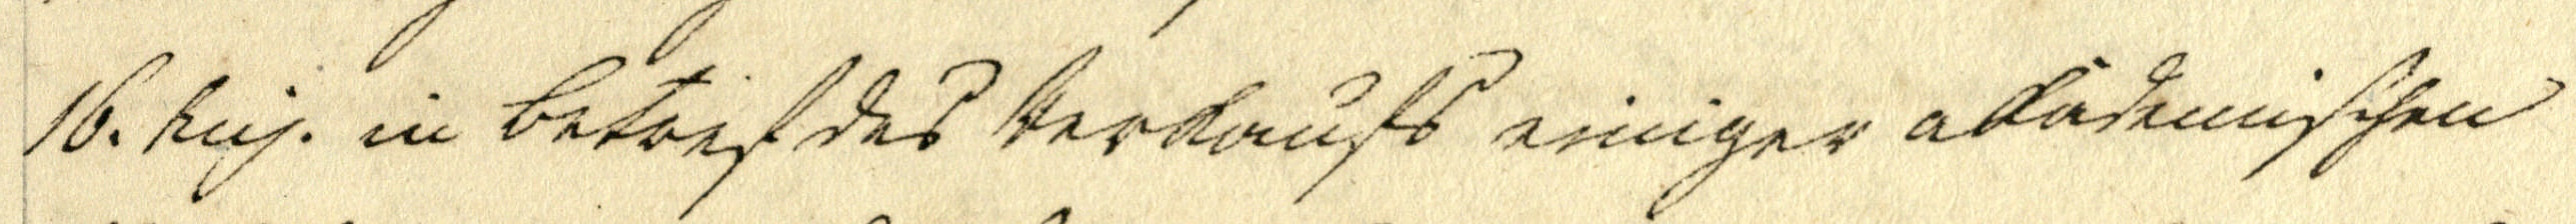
16. huj. in betref des Verkaufs einiger akademischen
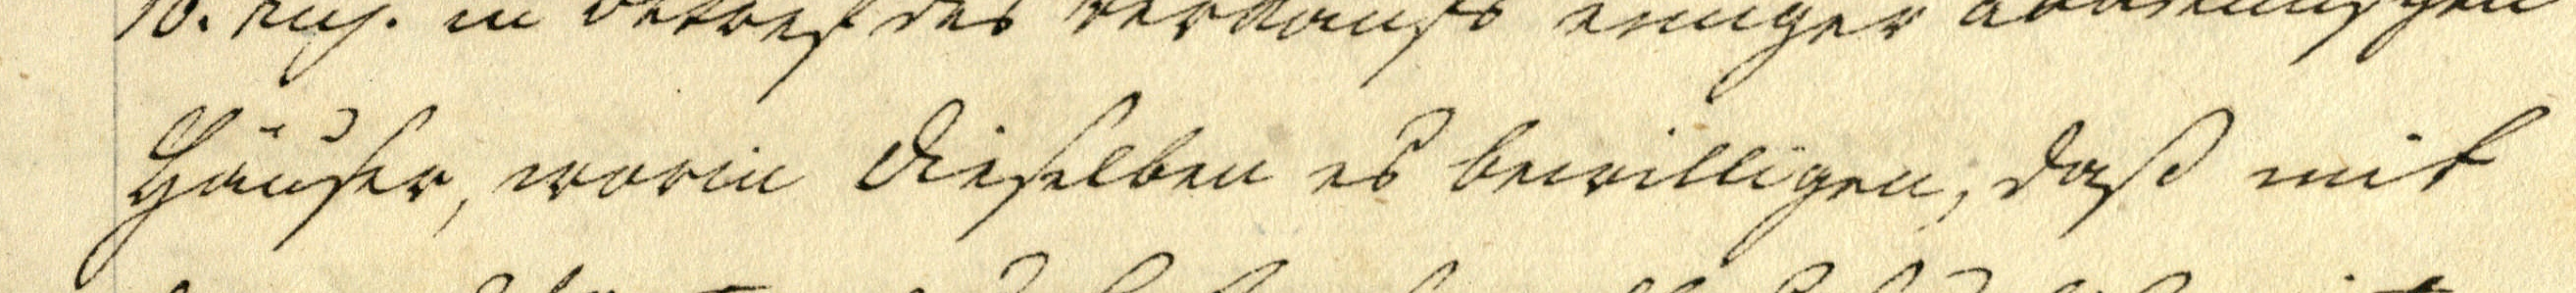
Häuser, worin dieselben es bewilligen, daß mit
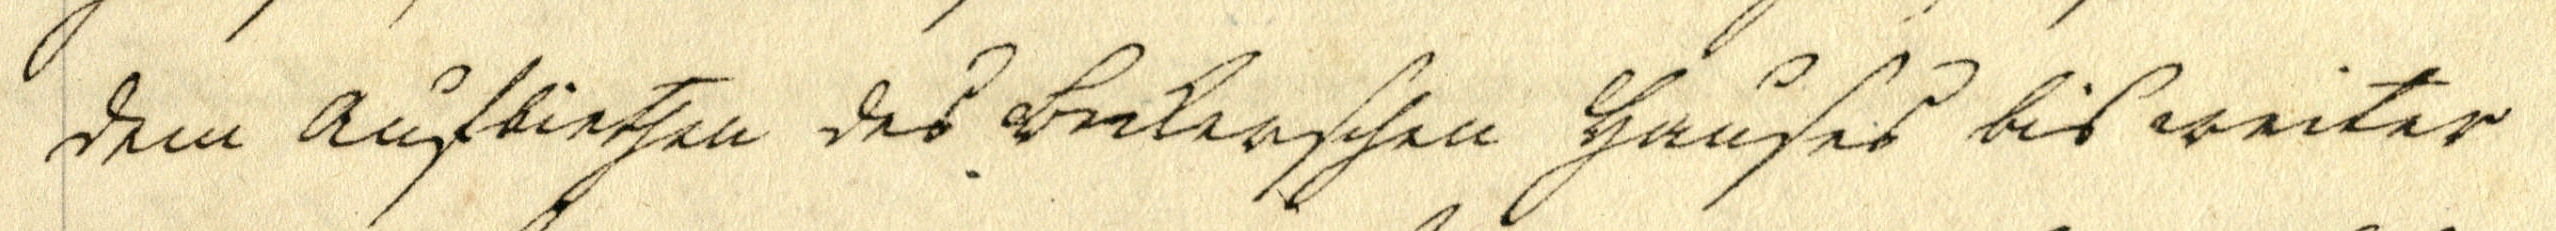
dem Aufbiethen des Beckerschen Hauses bis weiter
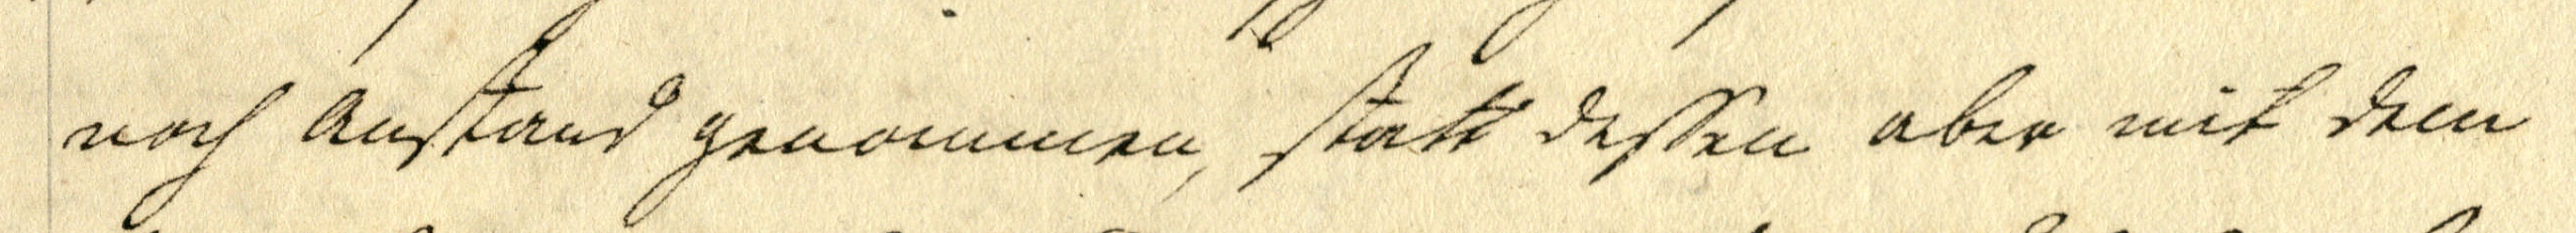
noch Anstand genommen, statt dessen aber mit dem
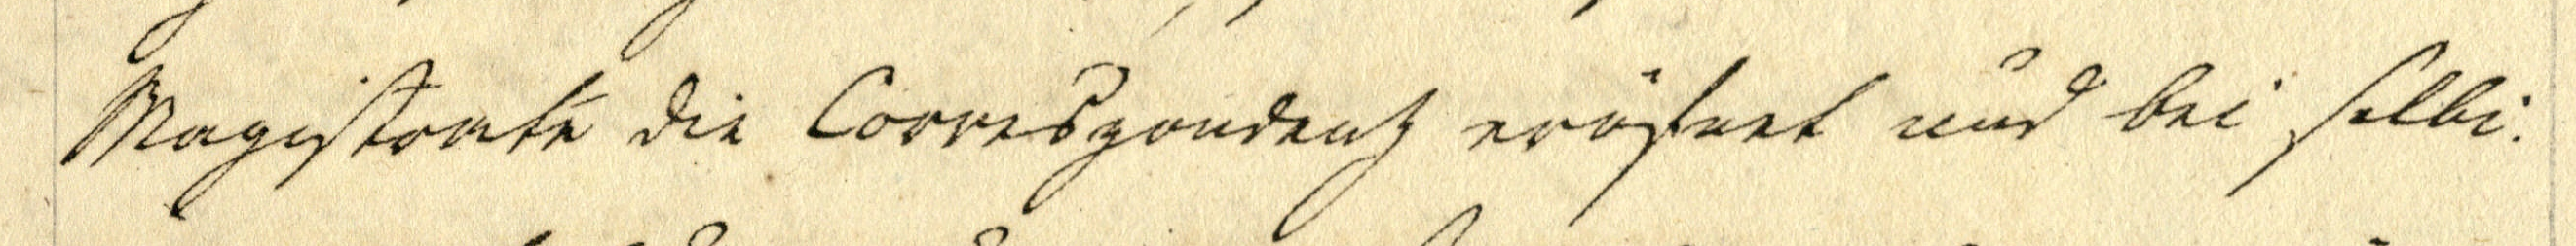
Magistrate die Correspondenz eröfnet und bei selbi¬
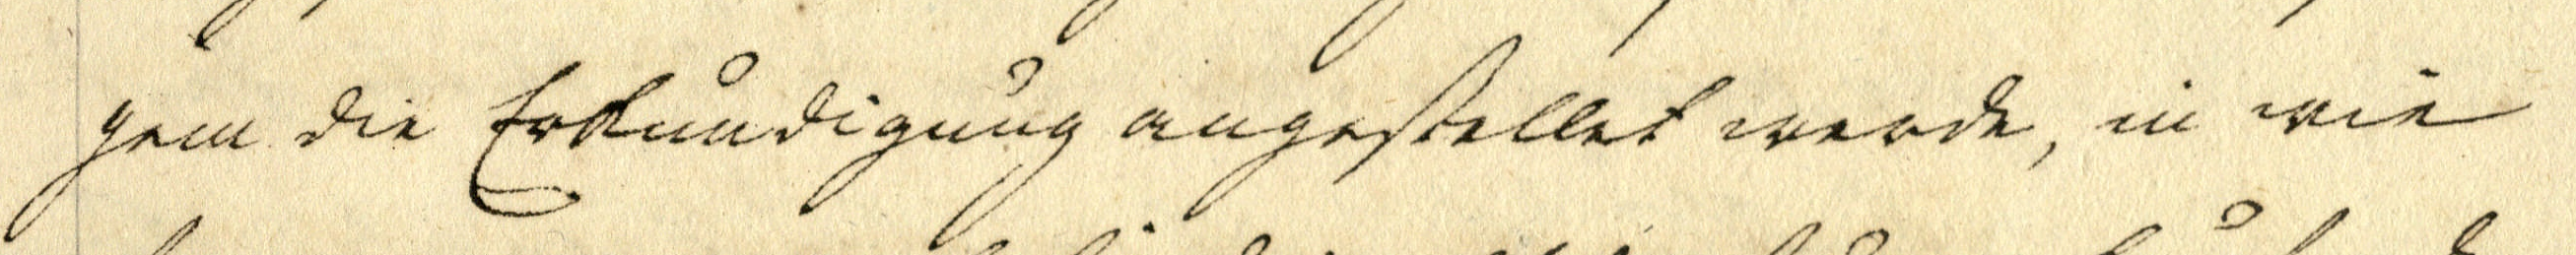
gem die Erkundigung angestellet werde, in wie¬
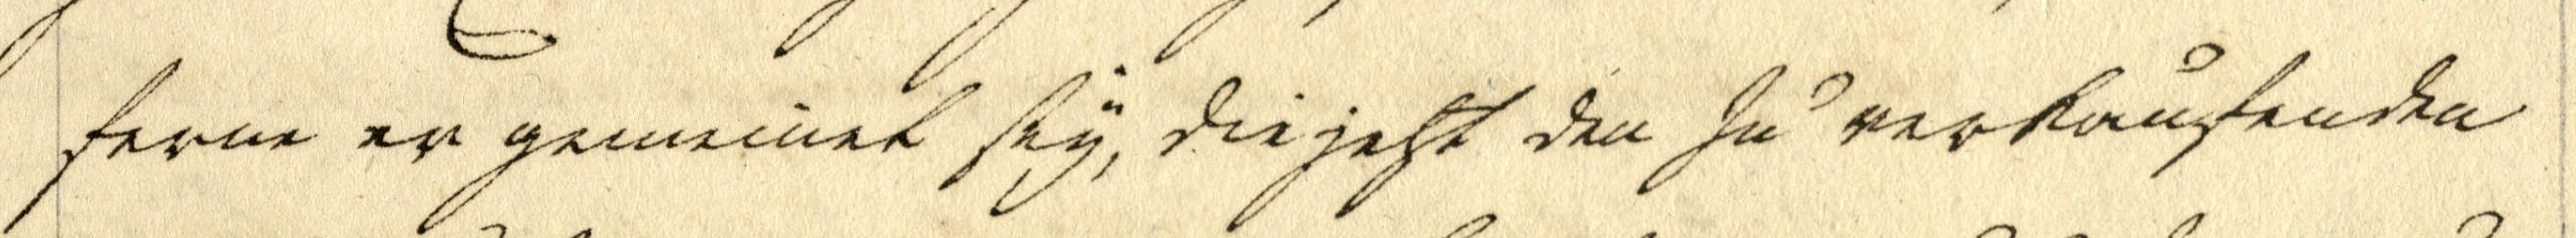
ferne er gemeinet seÿ, die jetzt den zu verkaufenden
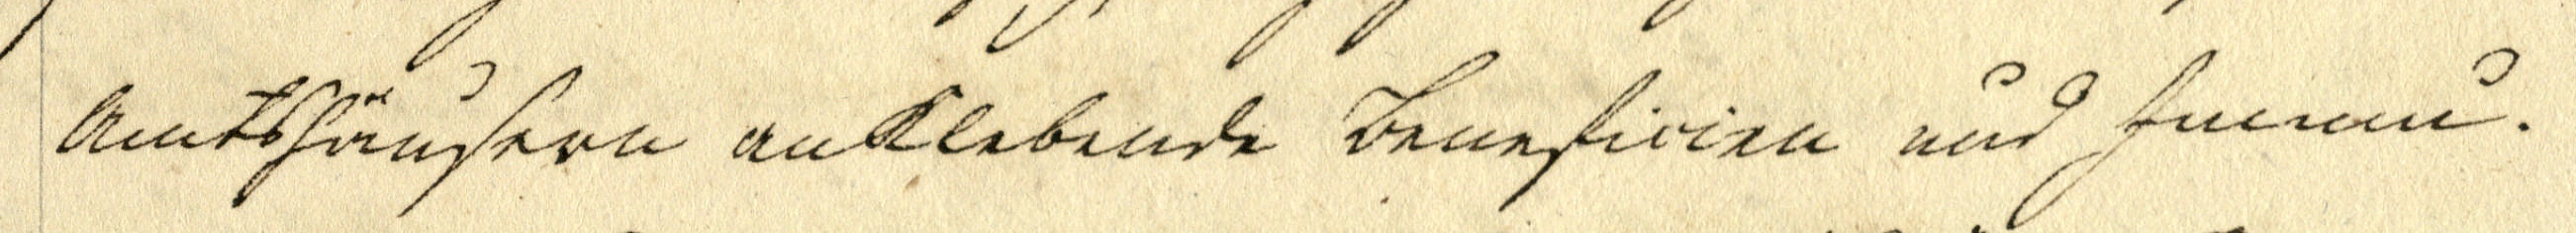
Amtshäusern anklebende Beneficien und Immu¬
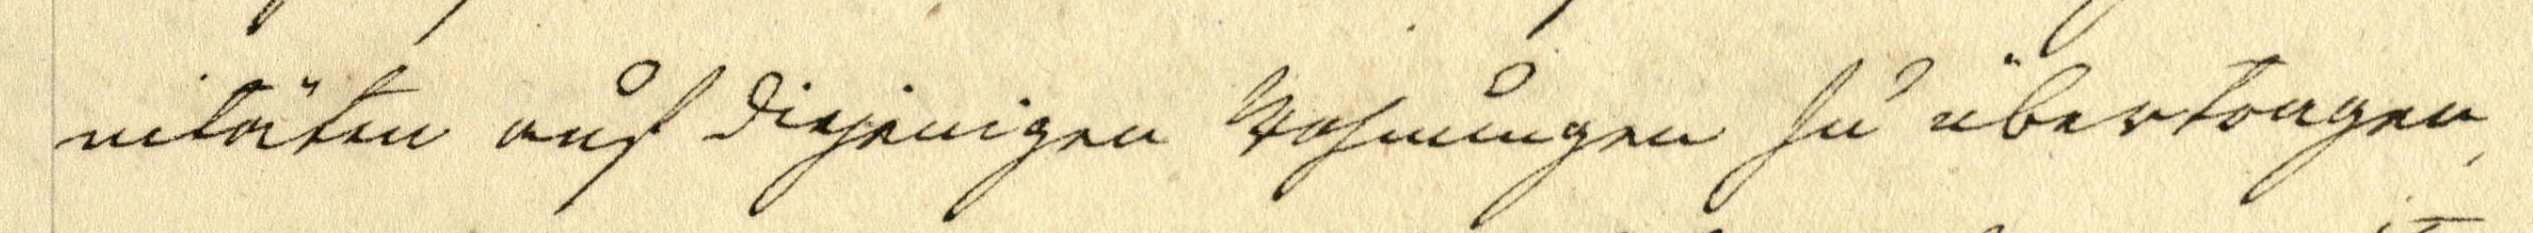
nitäten auf diejenigen Wohnungen zu übertragen
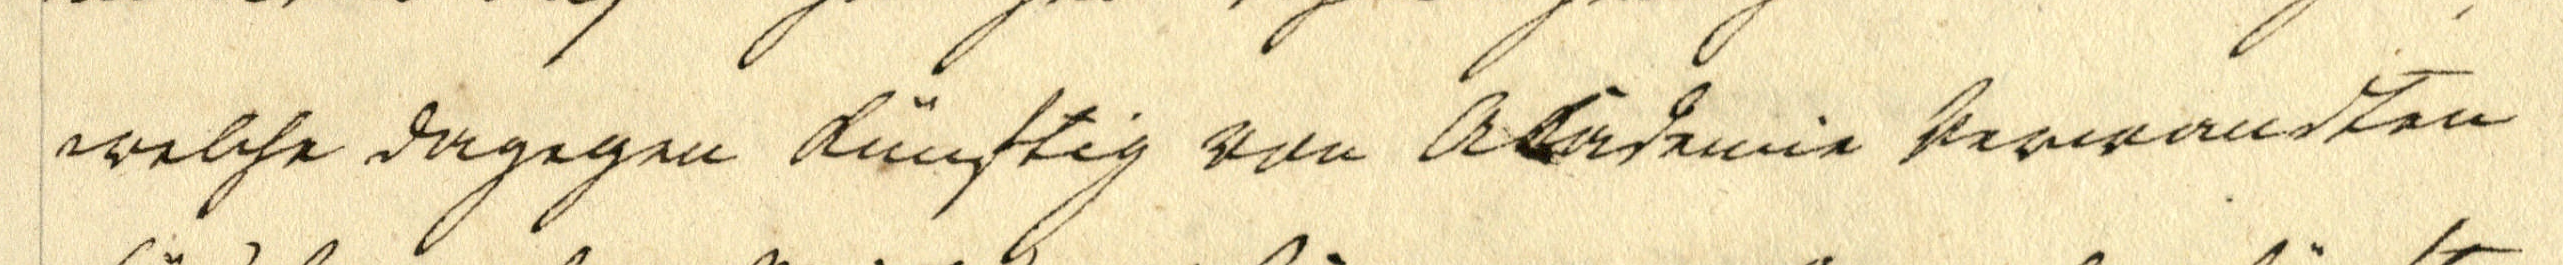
welche dagegen künftig von Akademie Verwandten
